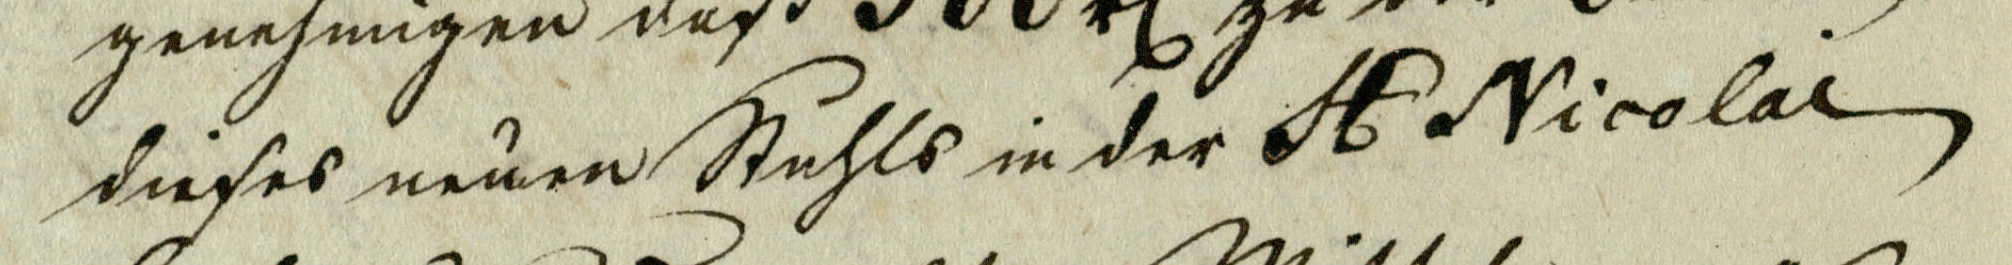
dieses neuen Stuhls in der St Nicolai
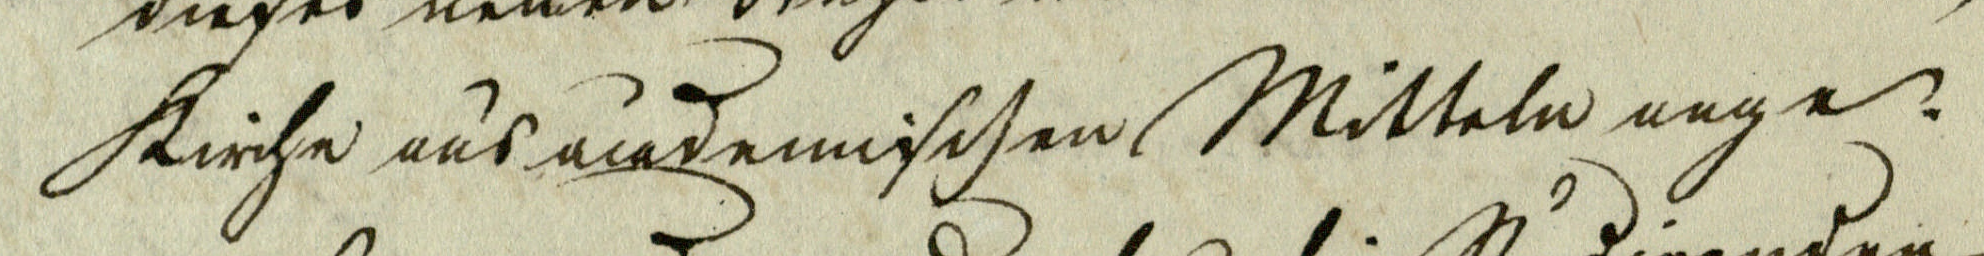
Kirche aus academischen Mitteln ange¬
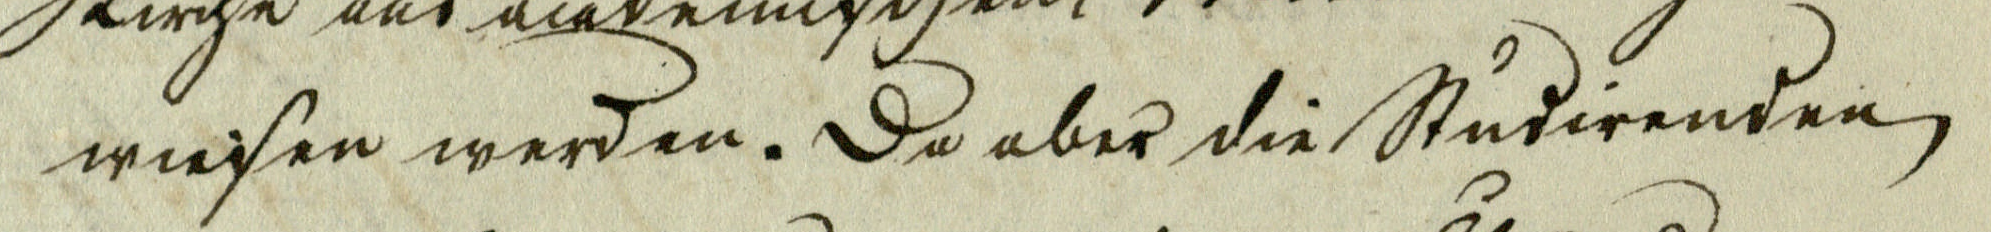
wiesen werden. Da aber die Studirenden
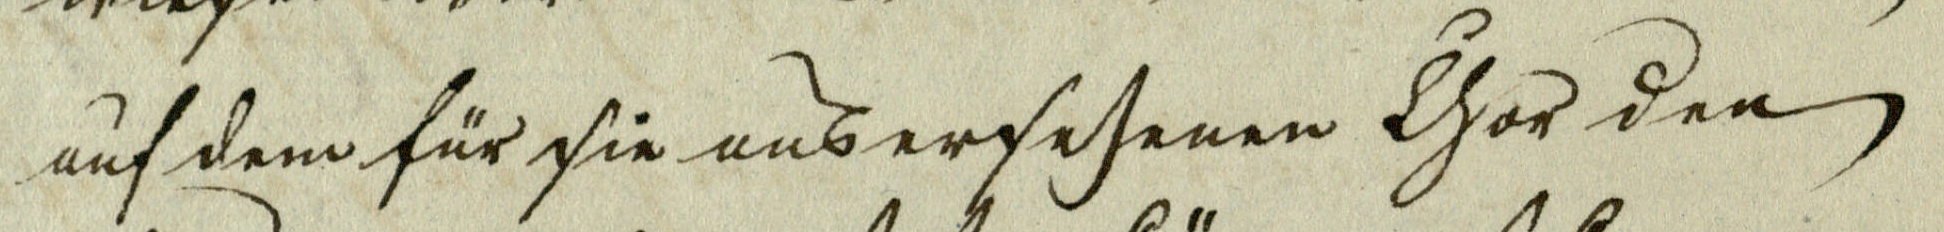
auf dem für sie ausersehenen Chor den
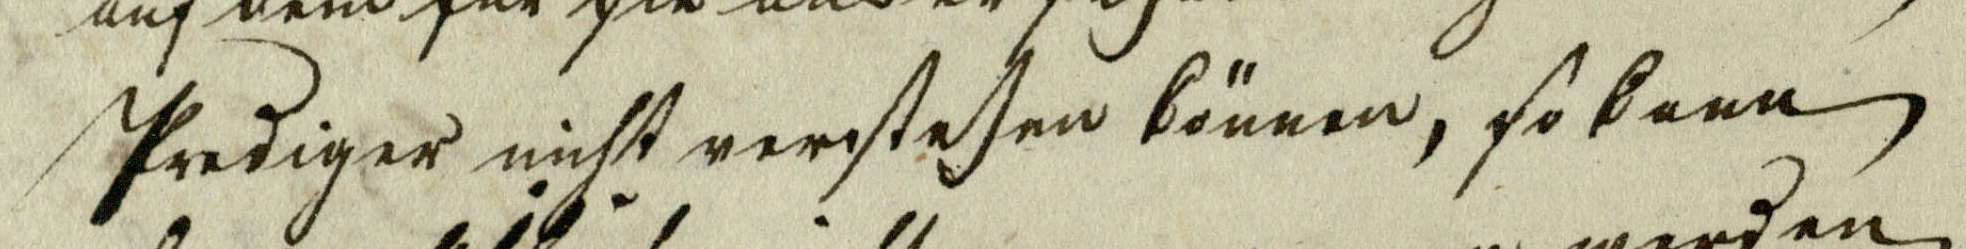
Prediger nicht verstehen können, so kann
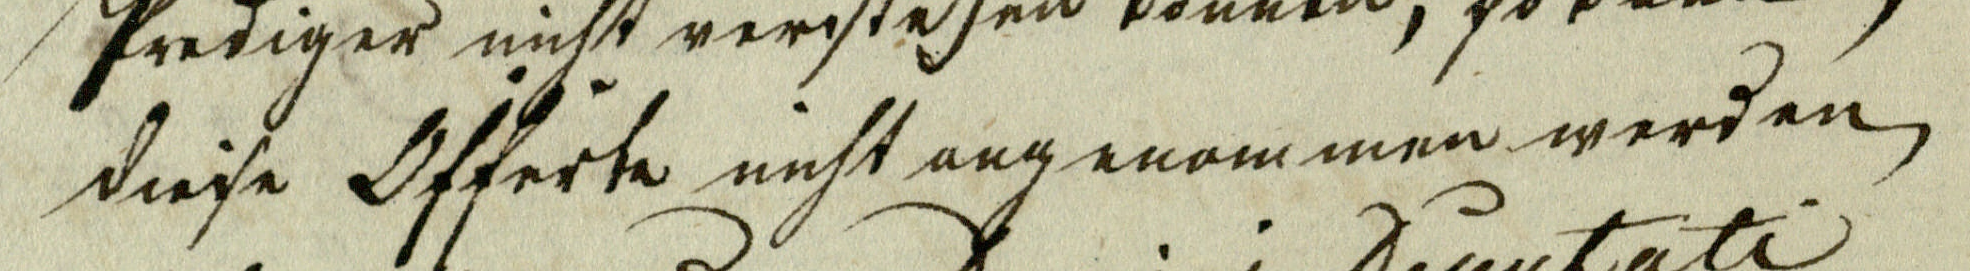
diese Offerte nicht angenommen werden
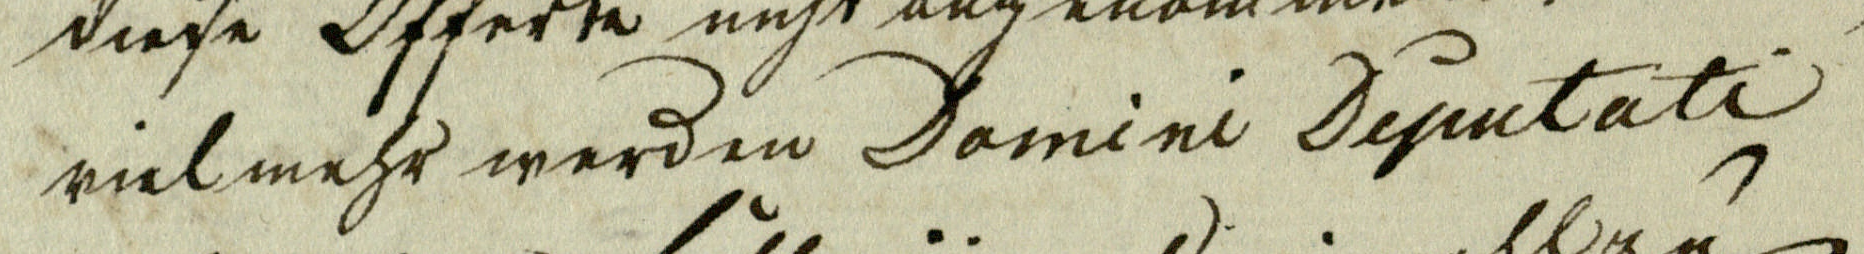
vielmehr werden Domini Deputati
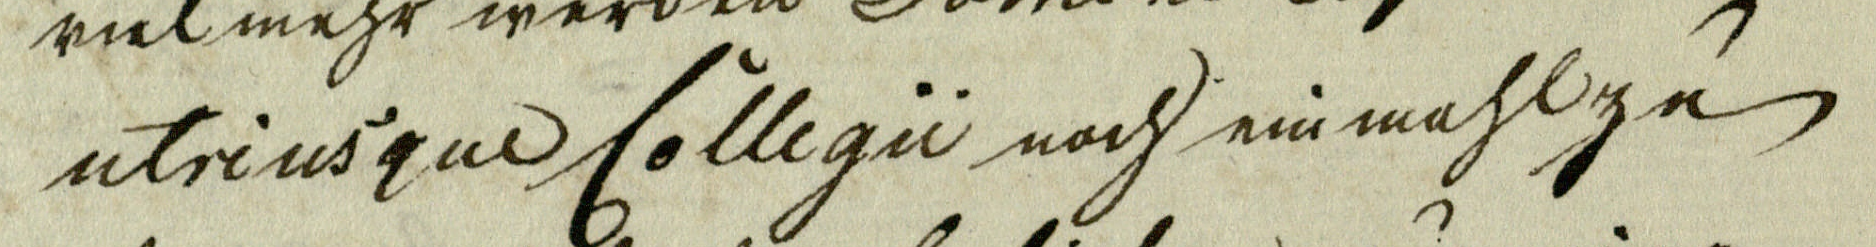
utriusque Collegii noch einmahl zu
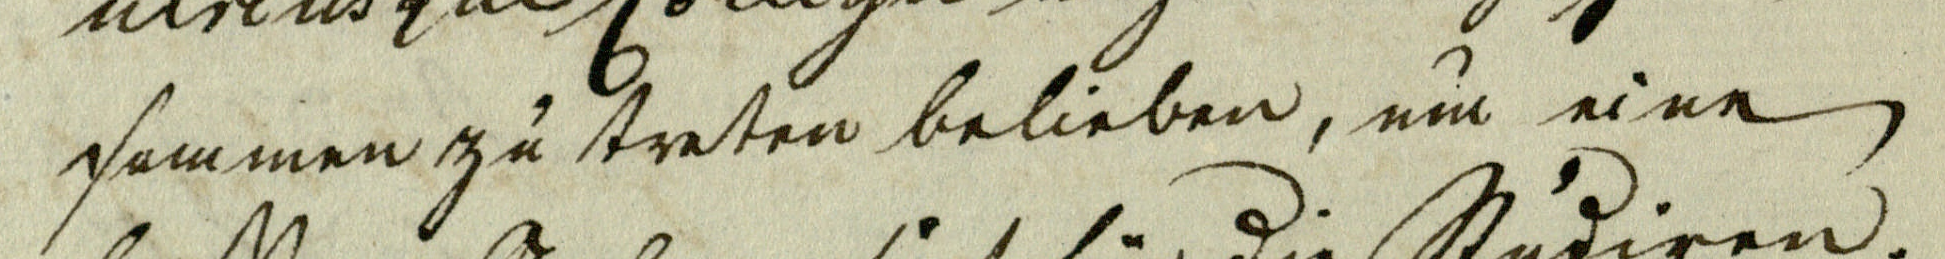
sammen zu treten belieben, um eine
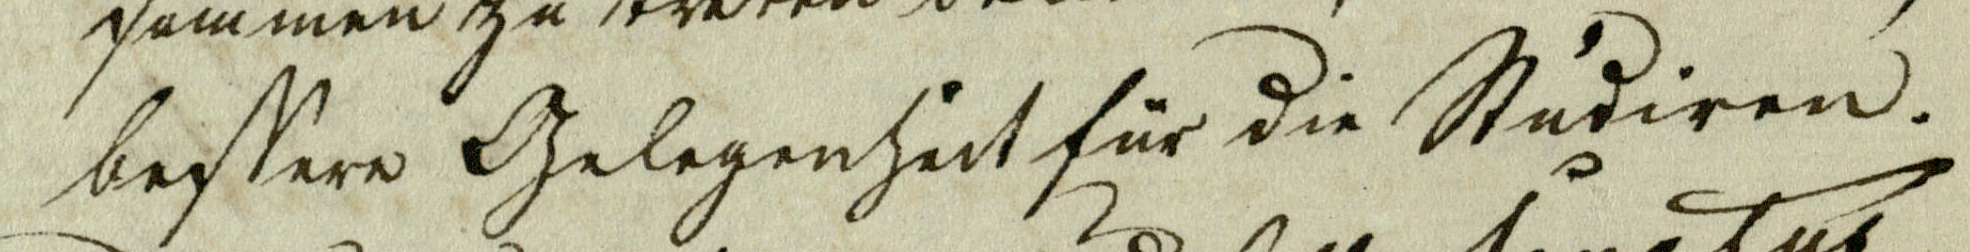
bessere Gelegenheit für die Studiren¬
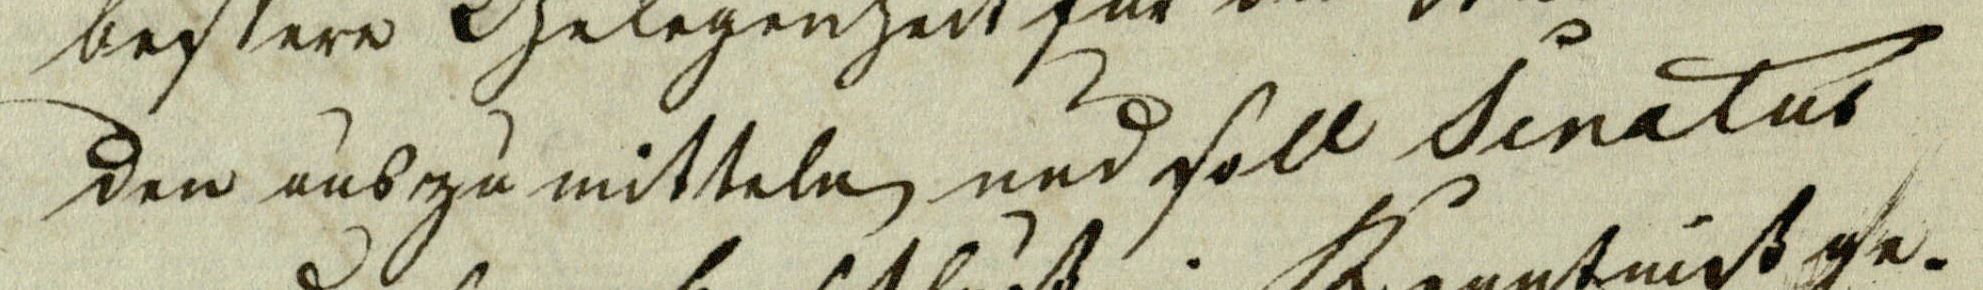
den auszumitteln und soll Senatus
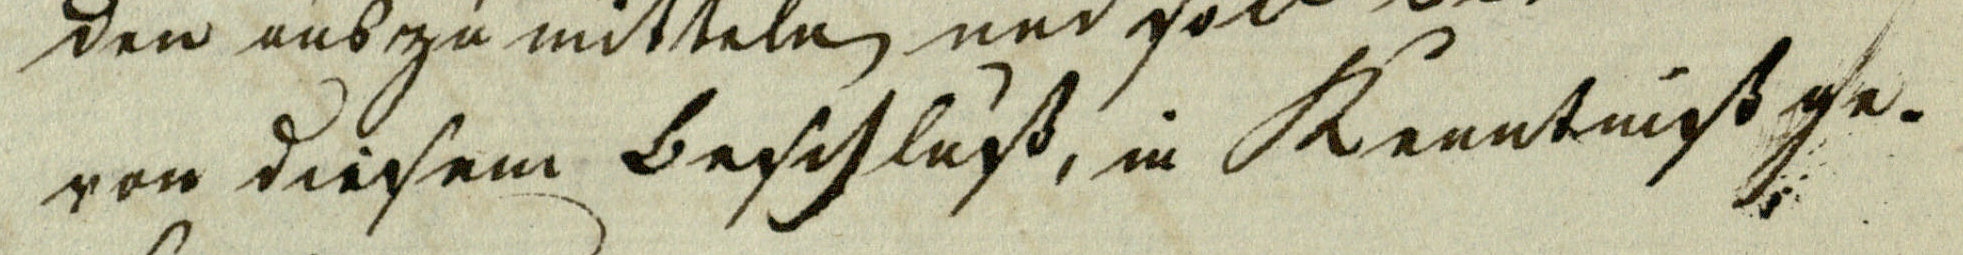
von diesem Beschluß, in Kenntniß ge¬
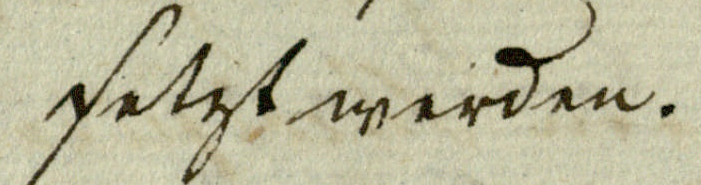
setzt werden.
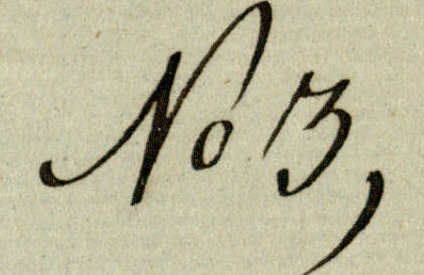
Nº 3,
